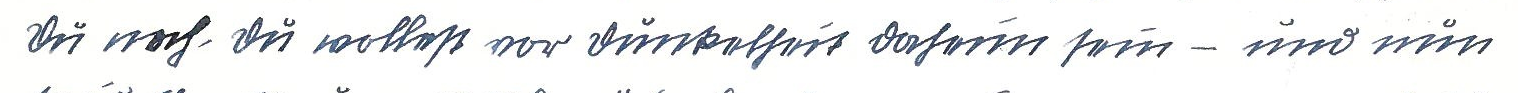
Du noch, Du wollest vor Dunkelheit daheim sein – und nun
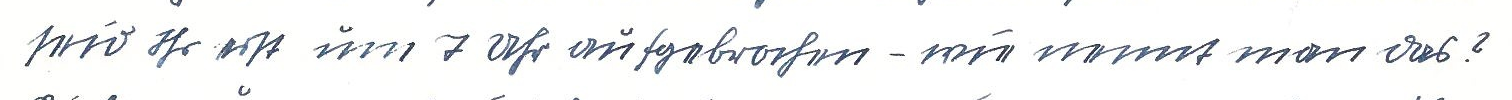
seid Ihr erst um 7 Uhr aufgebrochen – wie nennt man das?
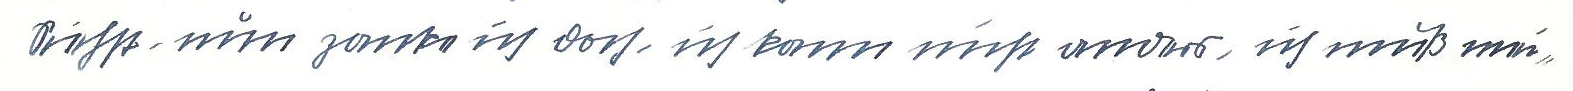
Siehst, nun zanke ich doch, ich kann nicht anders, ich muß mei¬
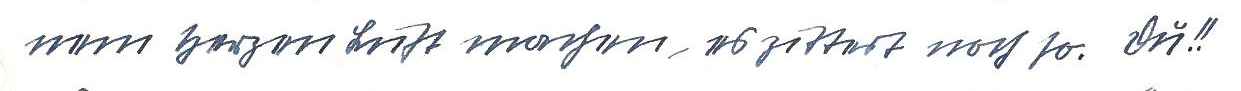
nem Herzen Luft machen, es zittert noch so. Du!!
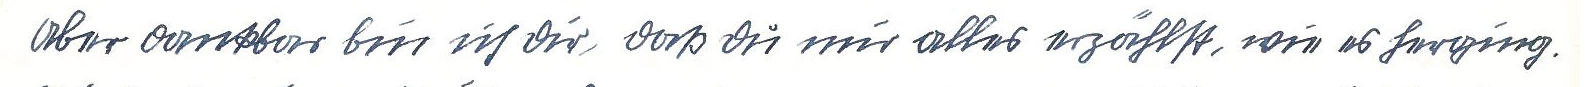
Aber dankbar bin ich Dir, daß Du mir alles erzählst, wie es herging.
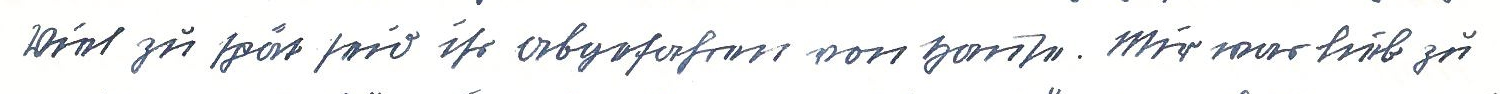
Viel zu spät seid Ihr abgefahren von Hause. Mir war lieb zu
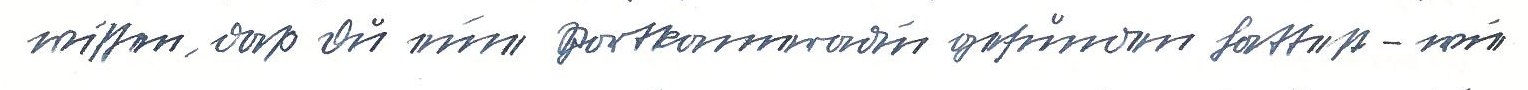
wissen, daß Du eine Sportkameradin gefunden hattest – wie
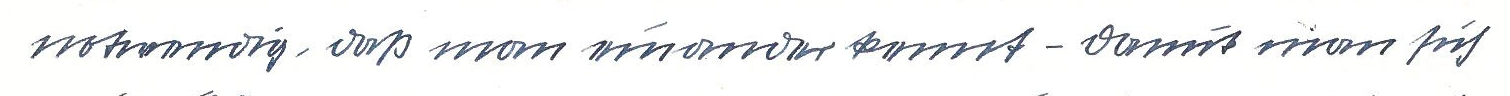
notwendig, daß man einander kennt – damit man sich
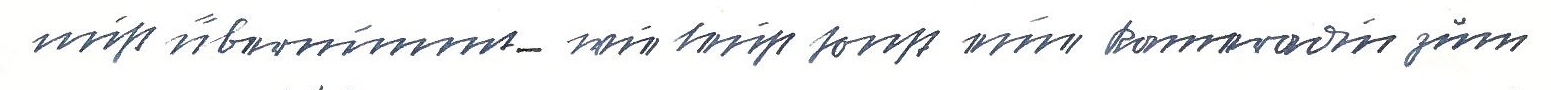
nicht übernimmt – wie leicht sonst eine Kameradin zum
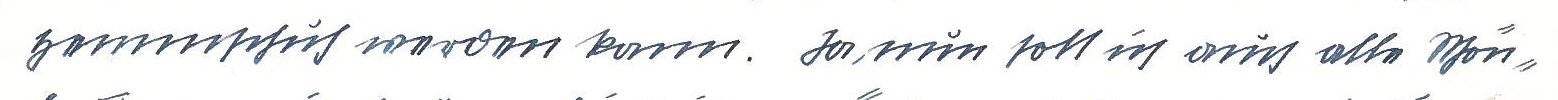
Hemmschuh werden kann. Ja, nun soll ich auch alle Schön¬
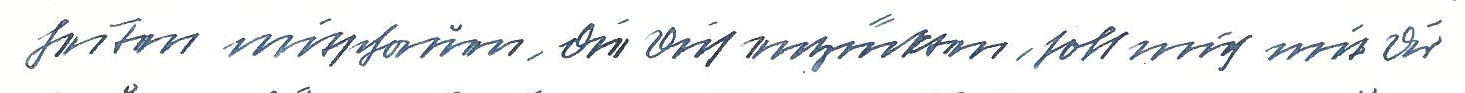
heiten mitschauen, die Dich entzückten, soll mich mit Dir
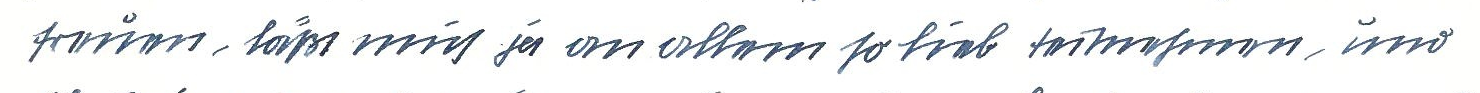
freuen, läßt mich ja an allem so lieb teilnehmen, und
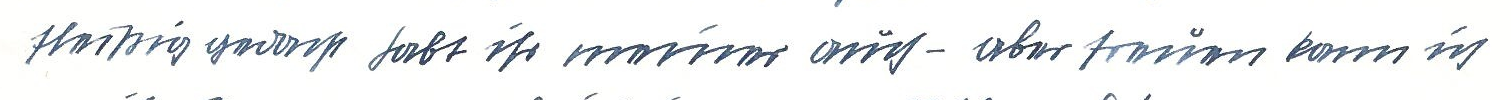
fleißig gedacht habt ihr meiner auch – aber freuen kann ich
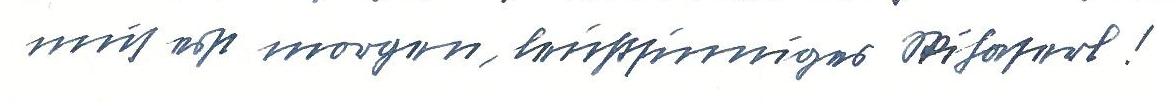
mich erst morgen, leichtsinniges Skihaserl!
